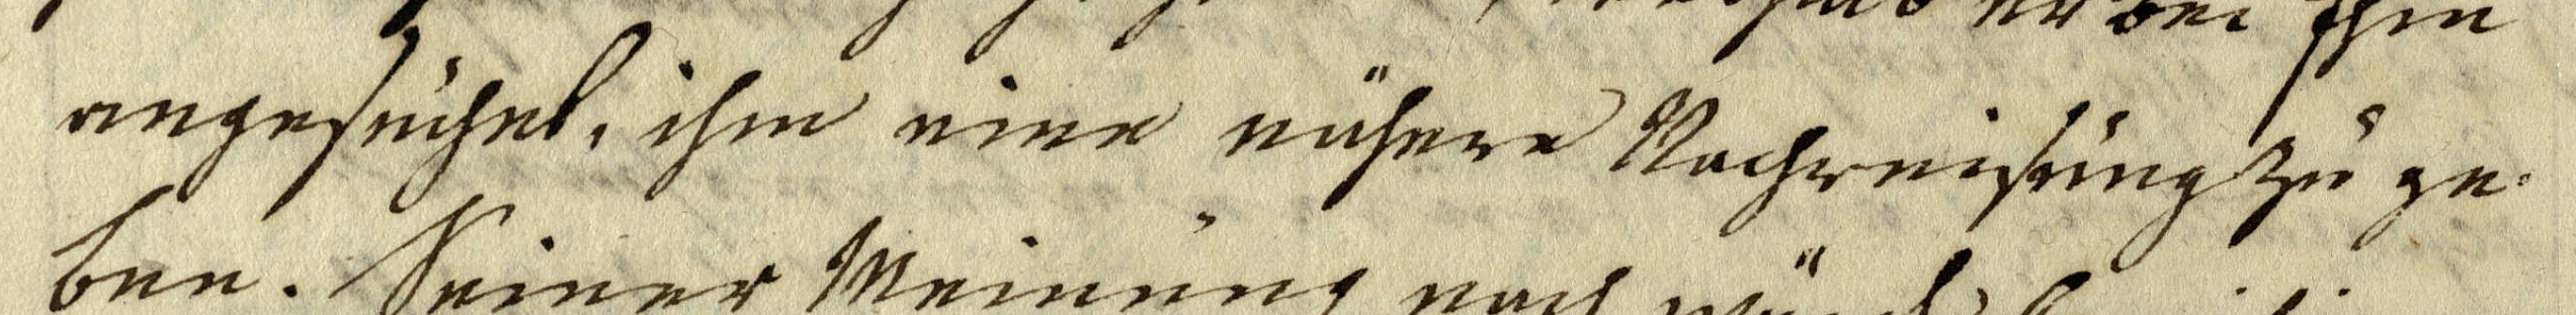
angesuchet, ihm eine nähere Nachweisung zu ge¬
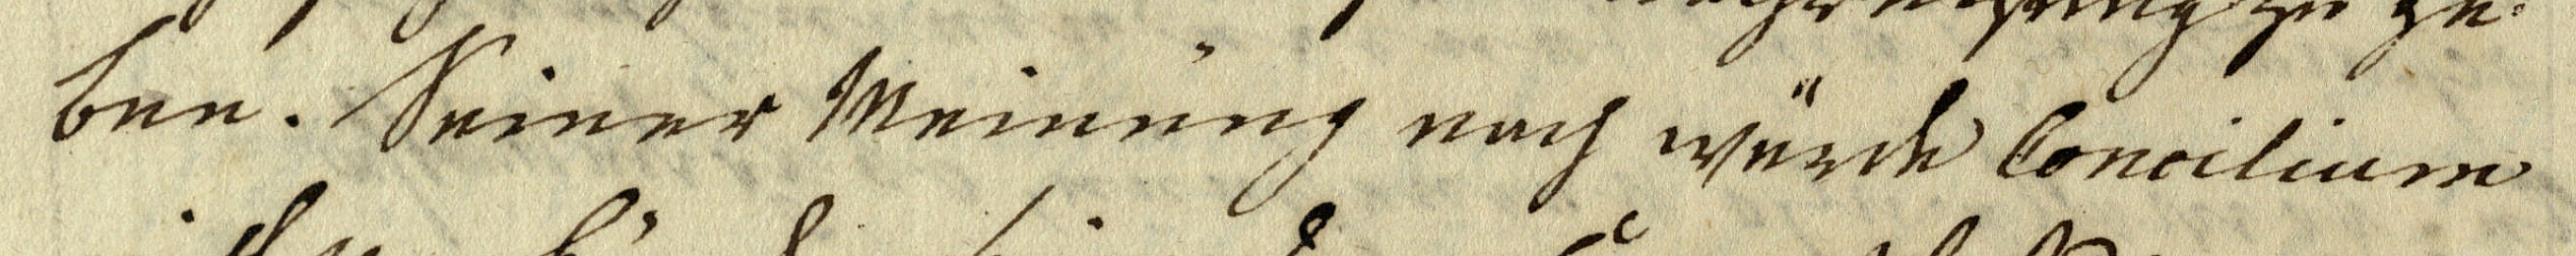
ben. Seiner Meinung nach würde Concilium
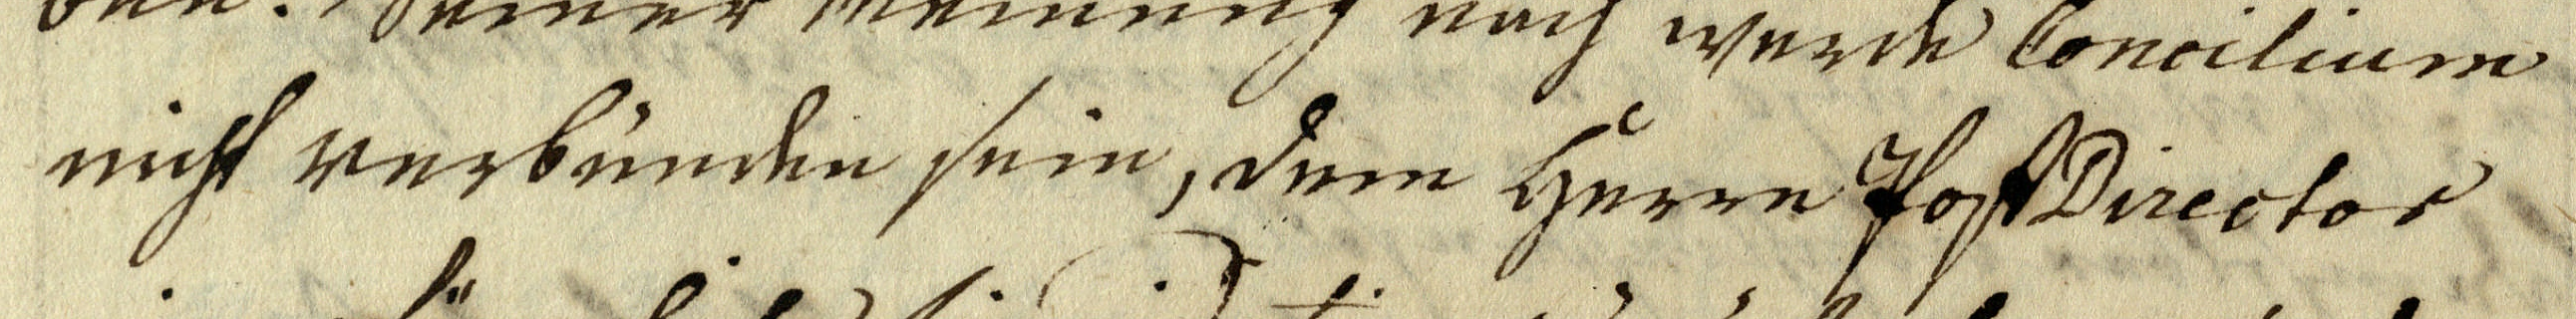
nicht verbunden sein, dem Herrn PostDirector
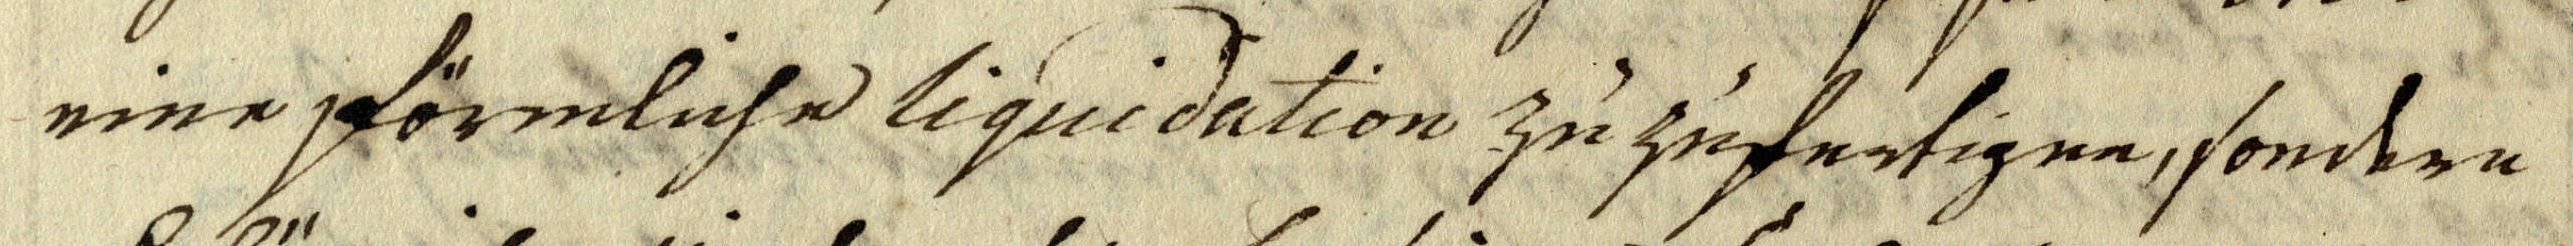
eine förmliche liquidation zu zufertigen, sondern
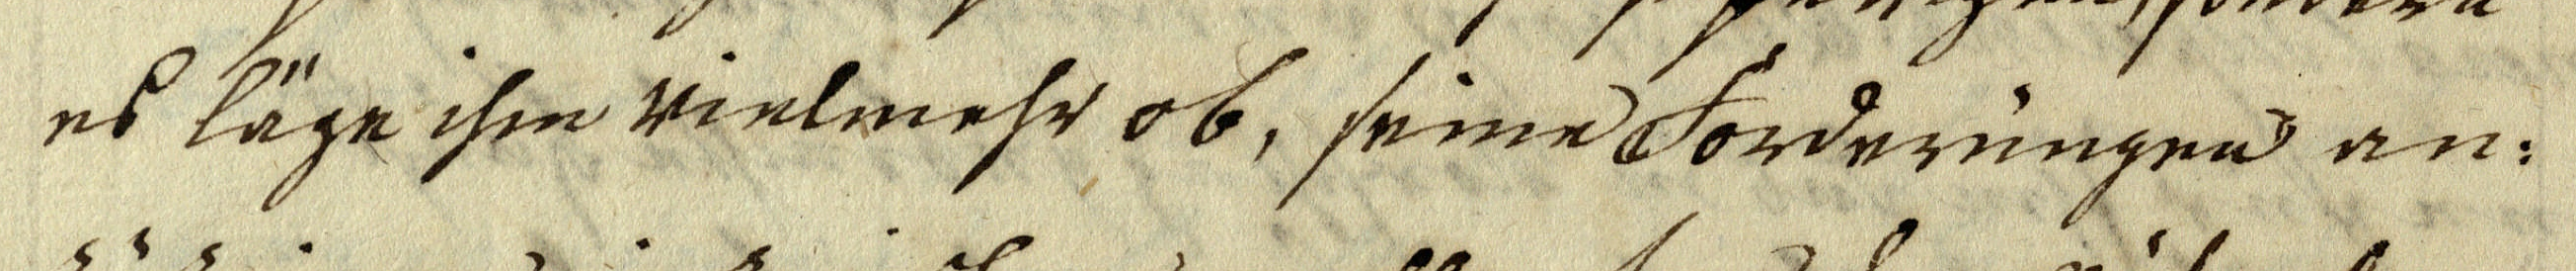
es läge ihm vielmehr ob, seine Forderungen an¬
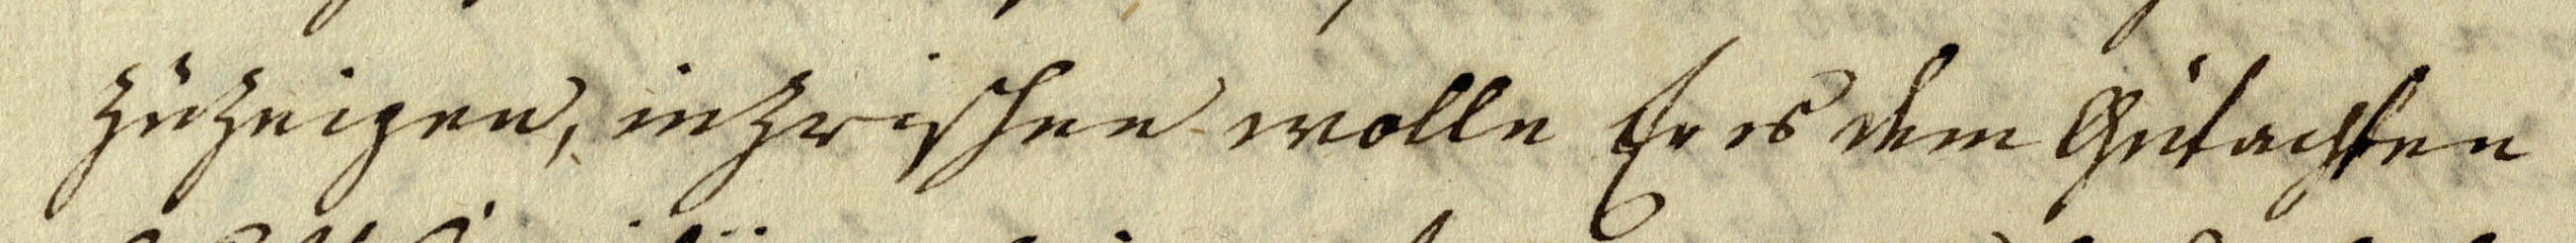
zuzeigen, inzwischen wolle Er es dem Gutachten
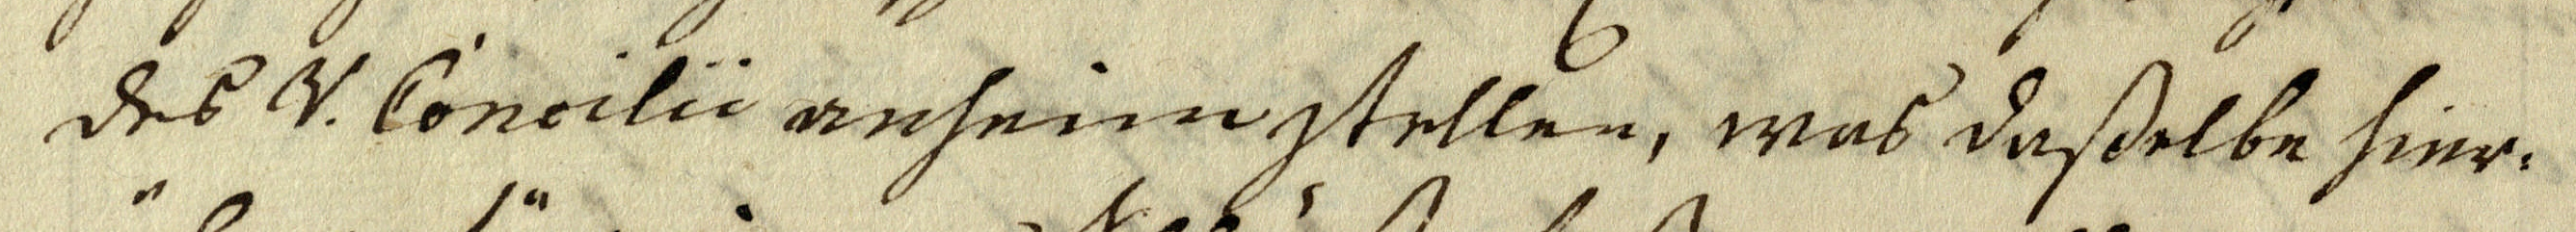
des V. Concilii anheim stellen, was daßelbe hier¬
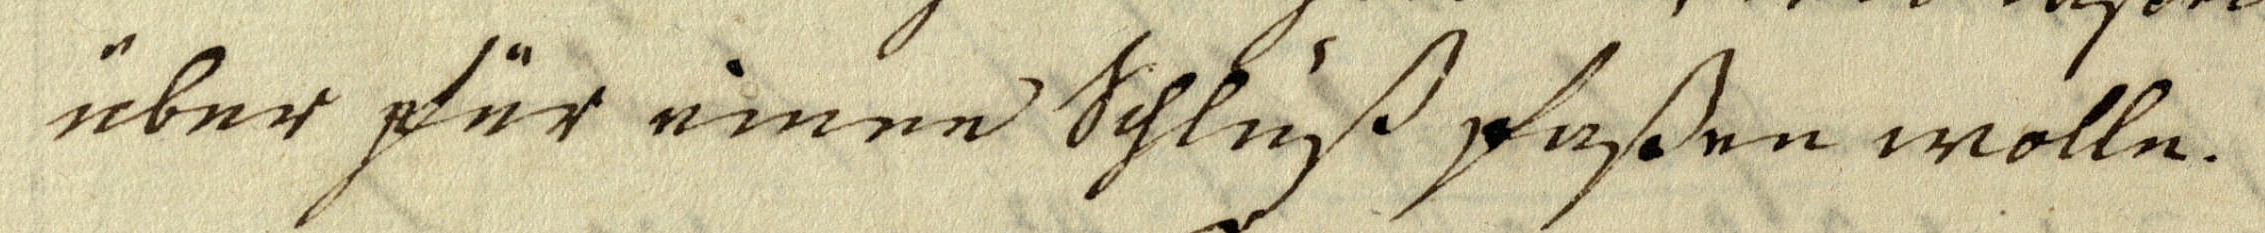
über für einen Schluß fassen wolle.
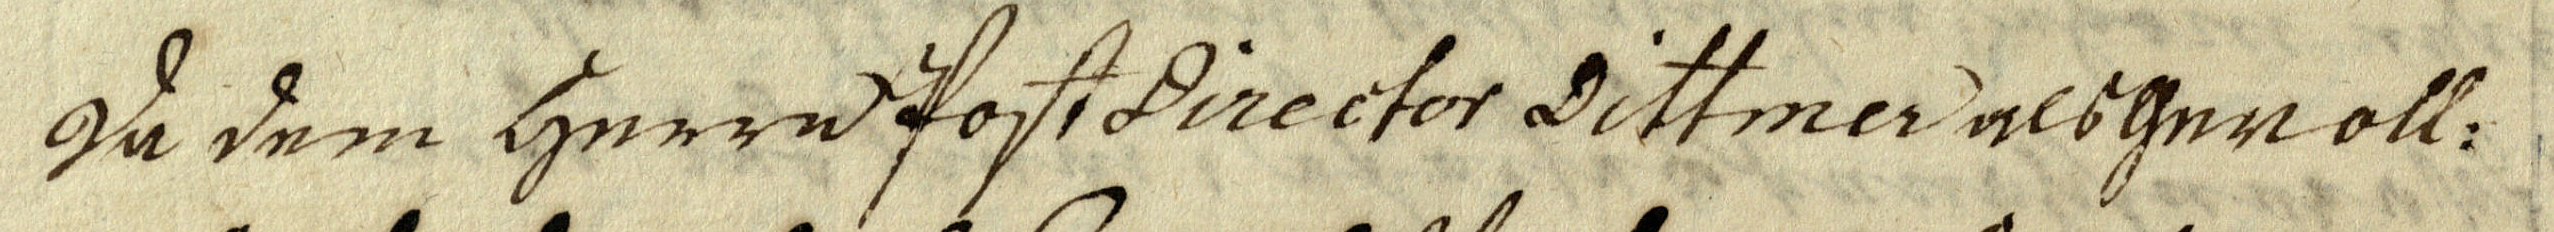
Da dem Herrn PostDirector Dittmer als Gevoll¬
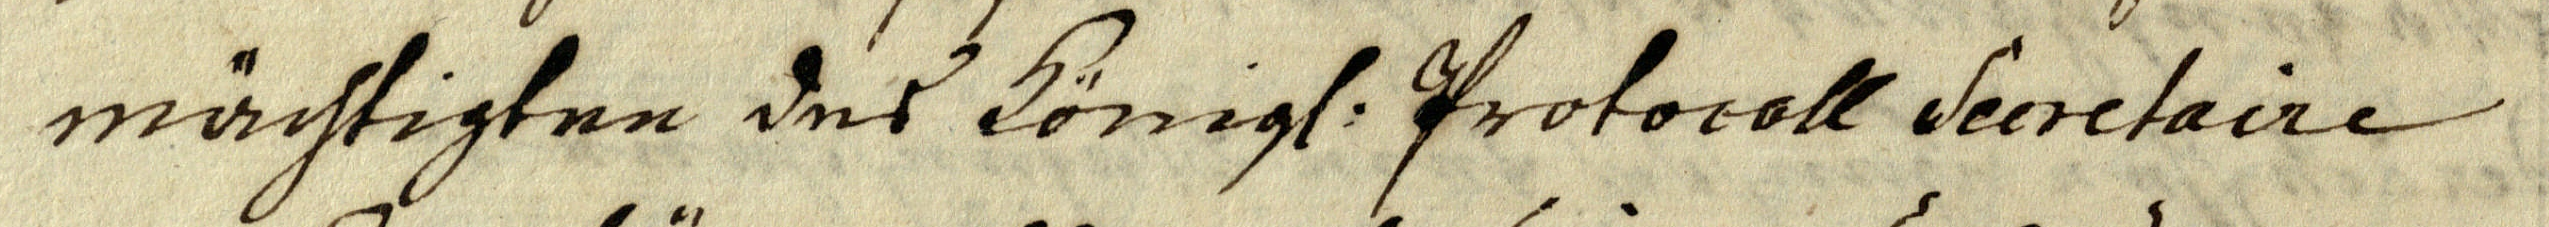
mächtigten des Königl. Protocoll Secretaire
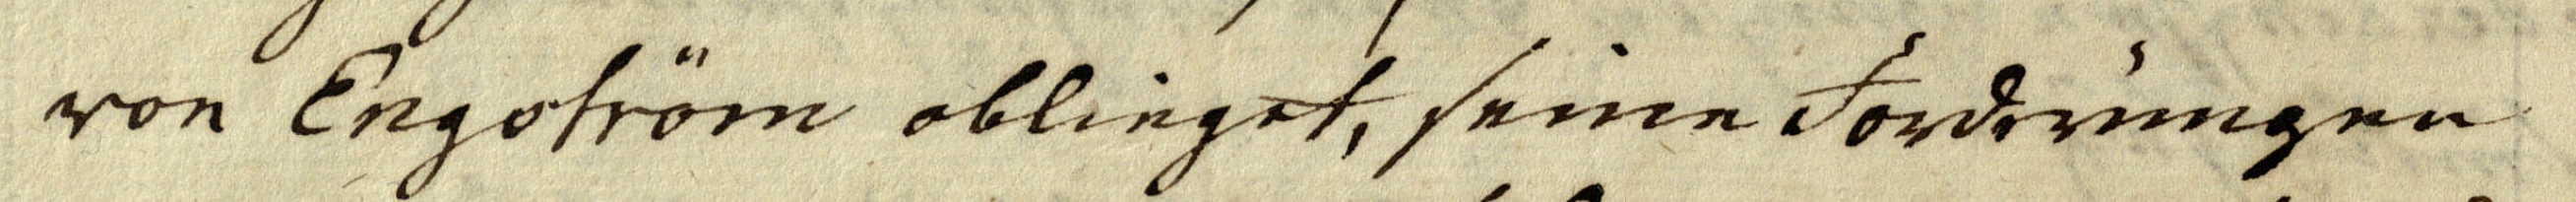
von Engström oblieget, seine Forderungen
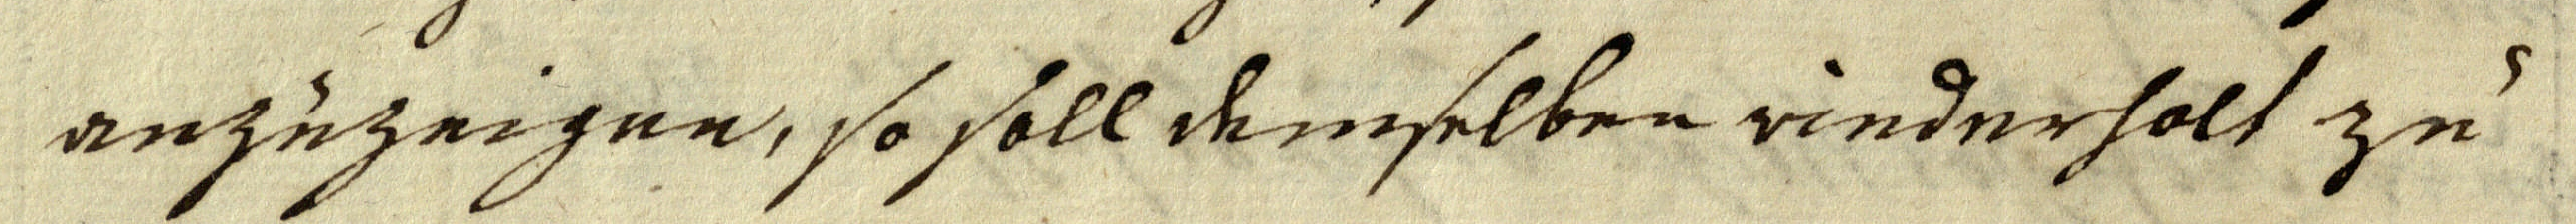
anzuzeigen, so soll demselben wiederholt zu
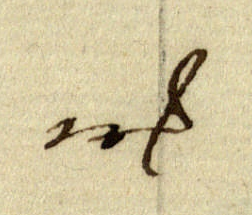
erk
